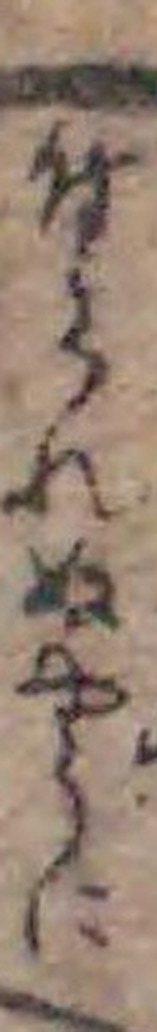付られぬやうに
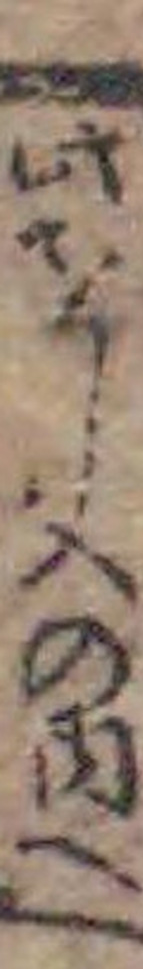此なし入の内へ
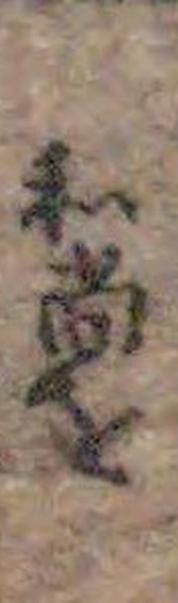和尚を
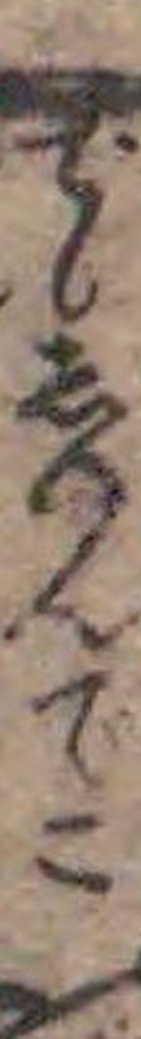でもしのんでこ
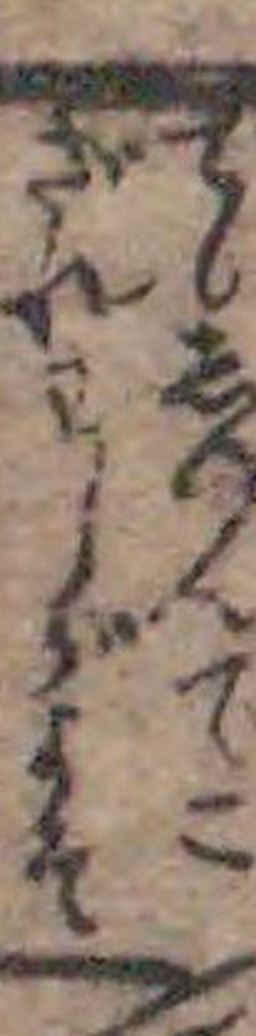ざれわしがよそ
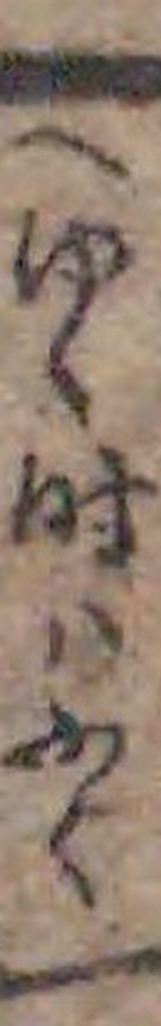へ行く時はふく
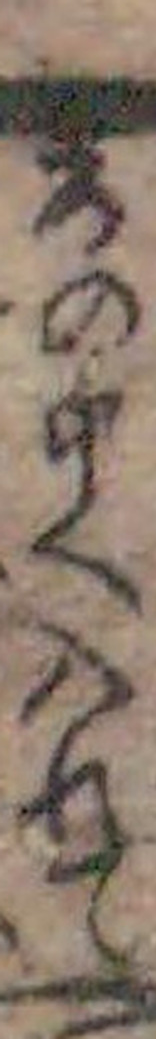ろの中へ入れて
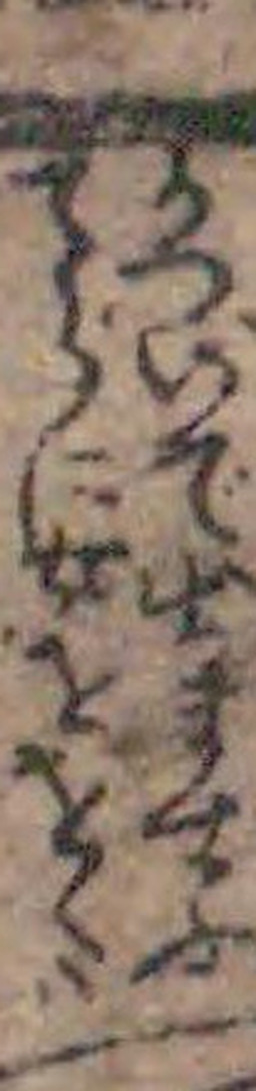てらに女ををくは
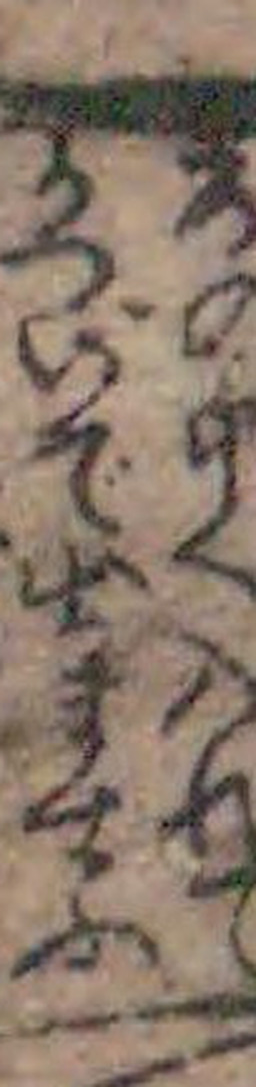かついで出ませふ
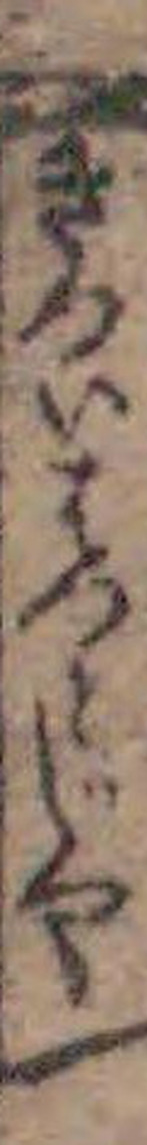きついはつとじや

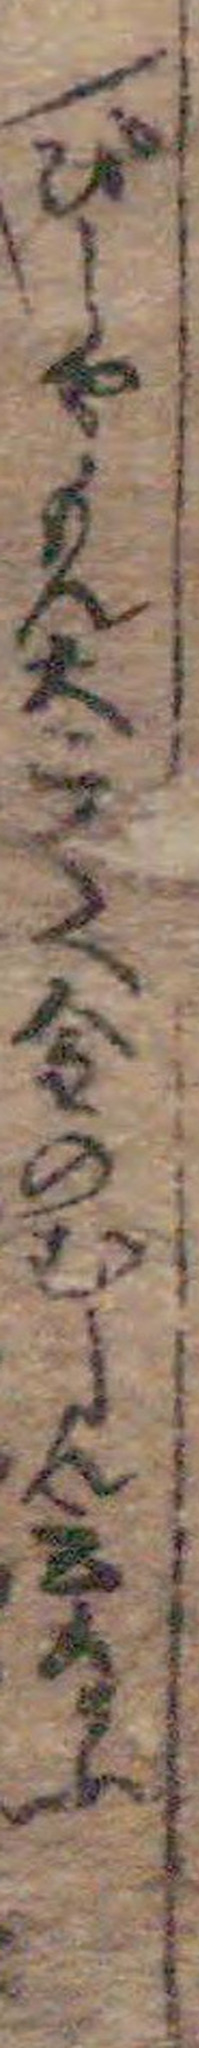びしやもん大こくへ金のむしん云給ふ
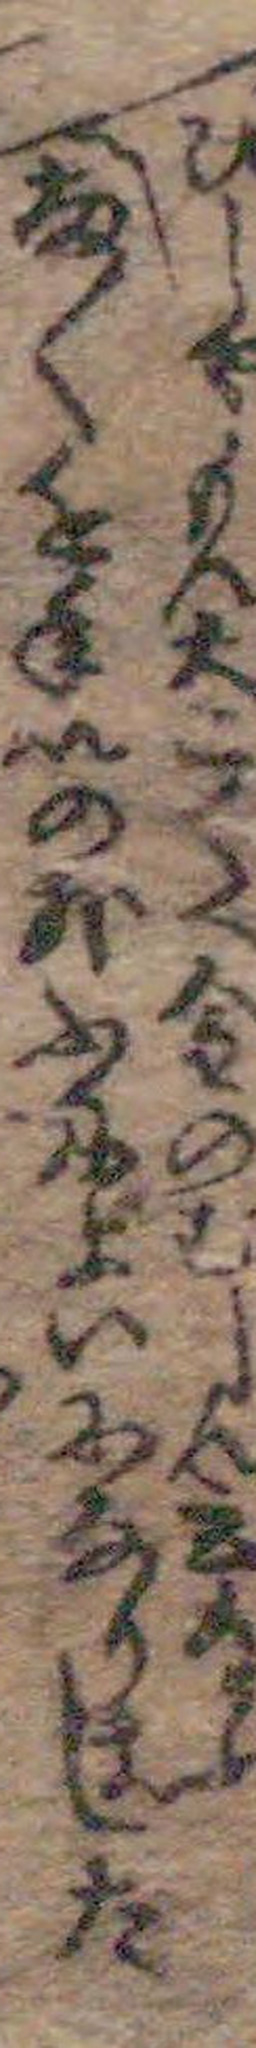〽扨〳〵近年以の外ふなよいになりました
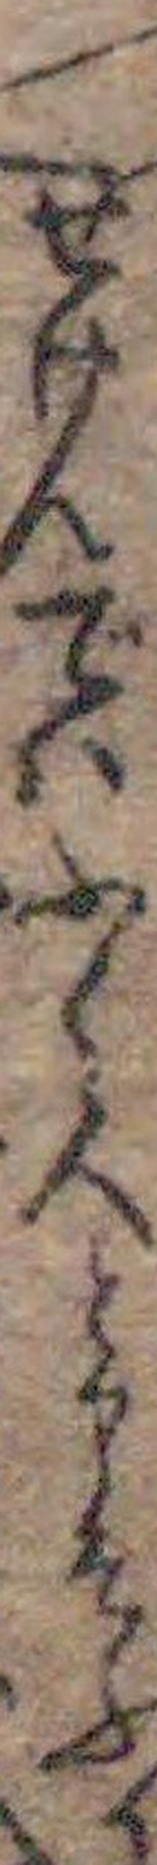せけんではふく人と申そふに
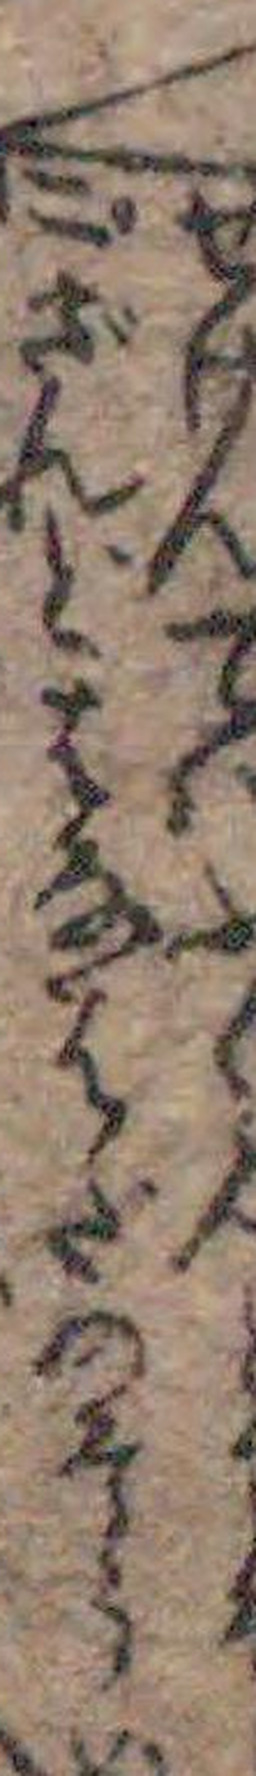ござれどはなはだのそうい
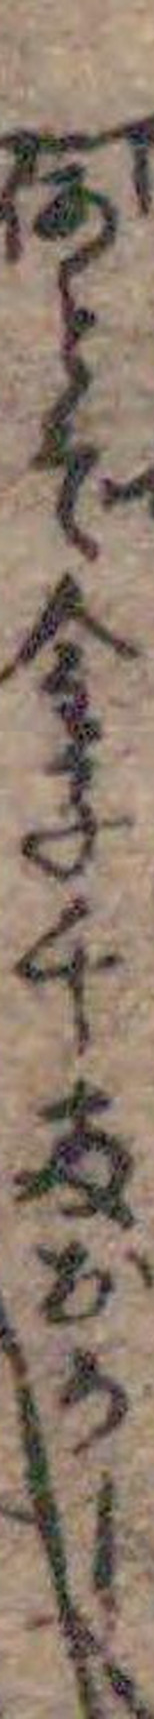何とぞ金子千両おかし
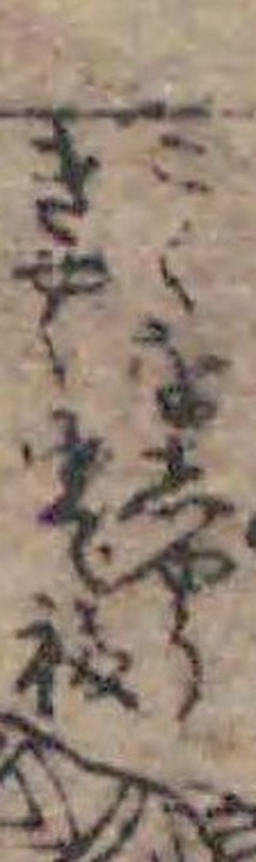きやくにて福
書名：蛭子大黒壮年過 : 2巻
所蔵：国立国会図書館 National Diet Library, JAPAN
